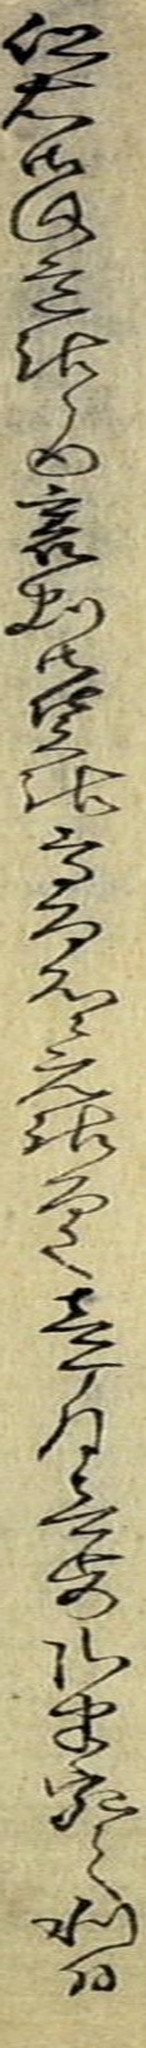但右御趣意銀之内裏判御貸銀高百石ニ元銀百匁壱ケ月壱歩弐朱宛之利付
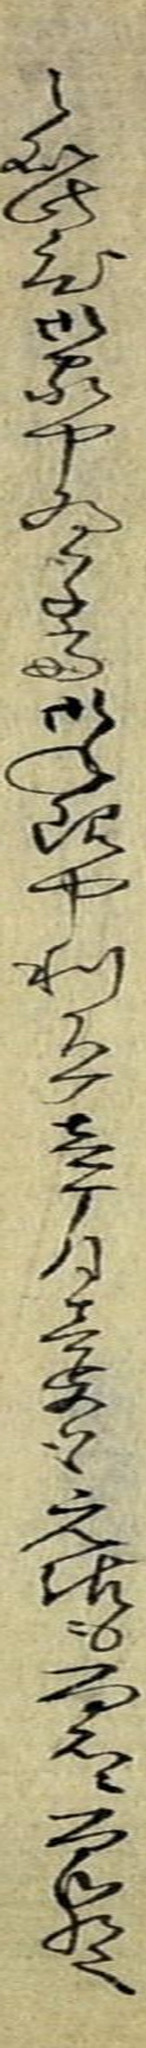之処此度御家中為御手当御年限中利下ケ壱ケ月壱歩ツヽ元銀も百石ニ百弐拾匁
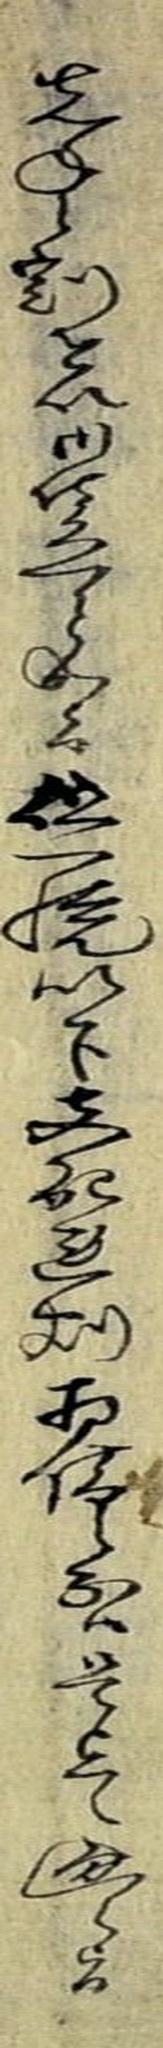先年之割を以御貸可被成旨但一統以下支配連判拝借之分ハ是迄之通之旨
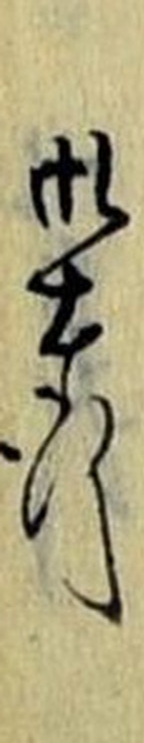御奉行
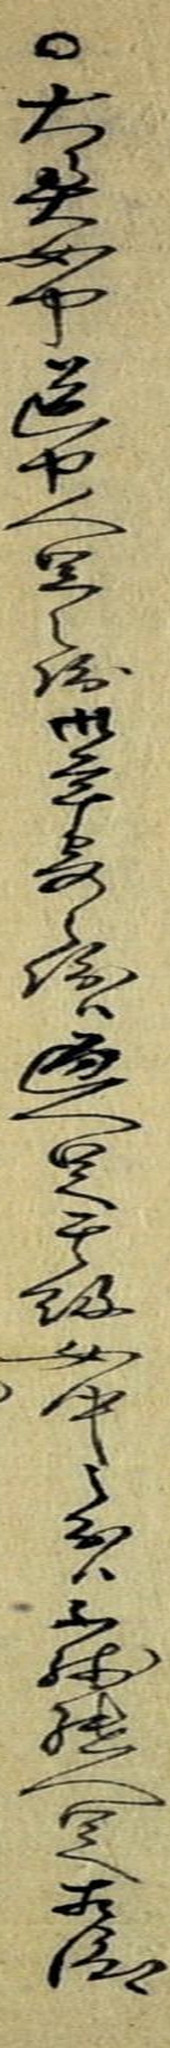〇大奥女中道中人足之儀御年寄之儀ハ通人足其余女中之分ハ不残継人足相渡候
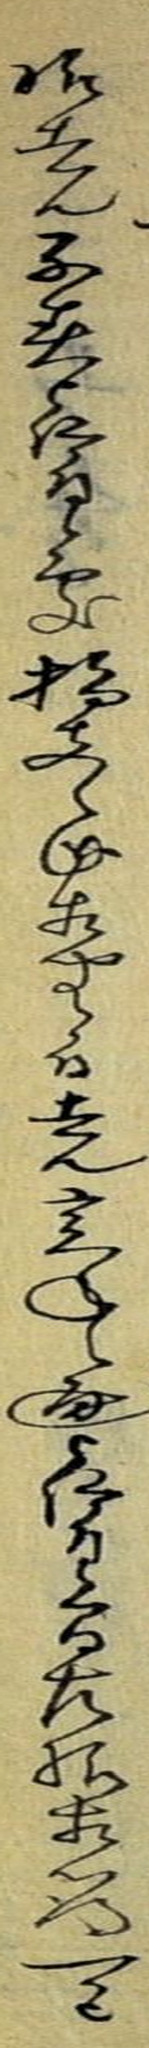様去ル子春被仰付候処指支之趣相聞候ニ付去ル亥年之通被仰付候間左様相心得可被
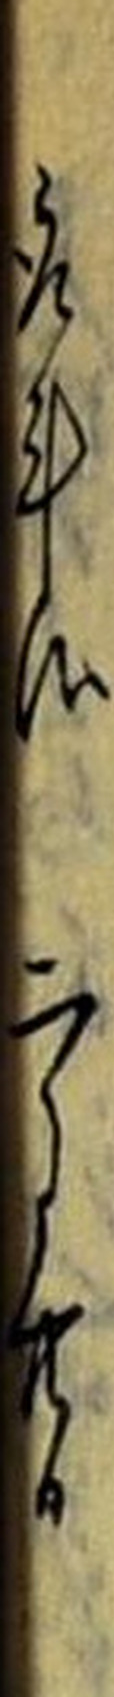取計候二月廿日
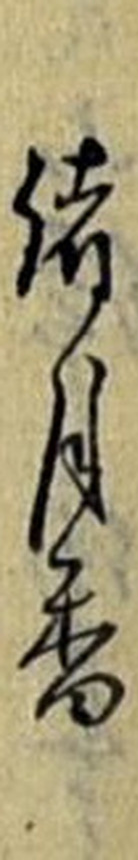諸月番
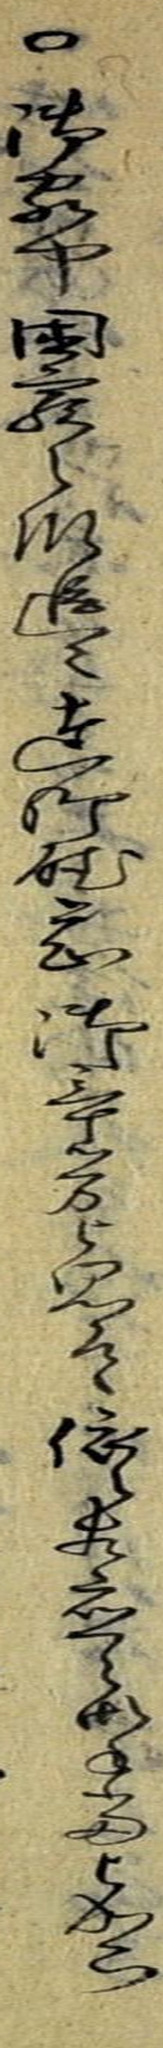〇御家中困窮之段追々達御聴甚御辛労被思召候依之相応之御手当被成下
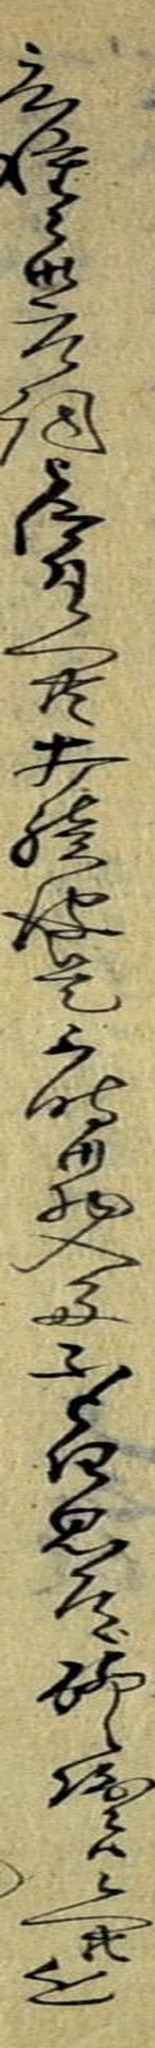度種々御取調被仰付候へ共打続彼是不時御物入多不被任思召候聊之儀ニハ候へ共近
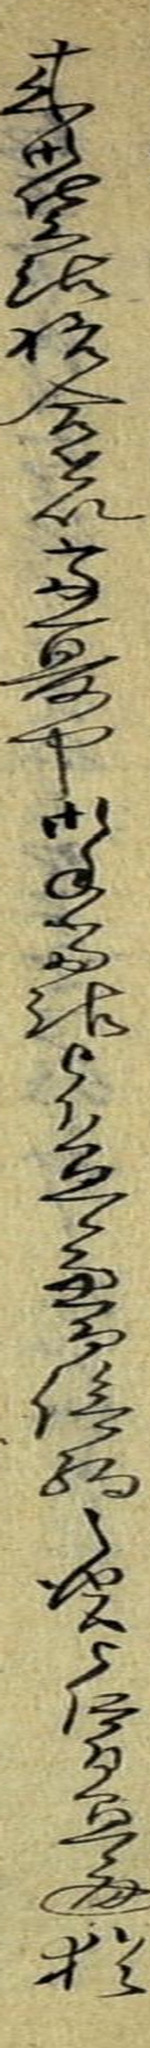来御貸銀格合を以当夏中御手当銀被下置候兼而倹約之儀ハ被仰付置候通猶
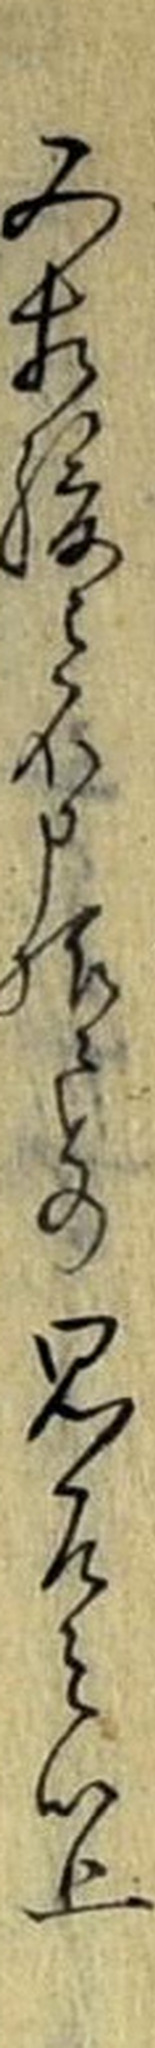又相緩ミ不申様ニとの思召ニ候以上
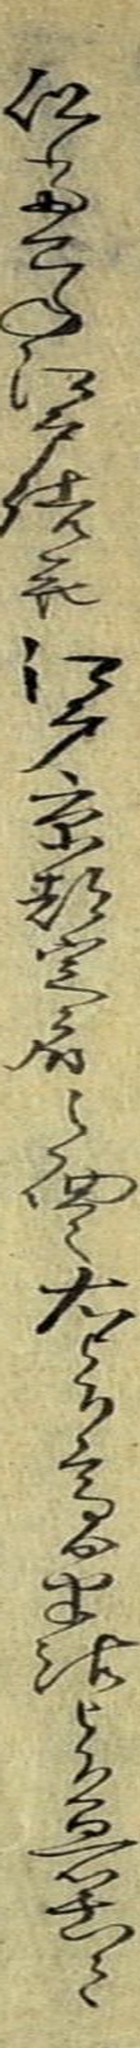但当巳年江戸詰并江戸京都定府之面々右被下高ゟ半銀被下置筈ニ候
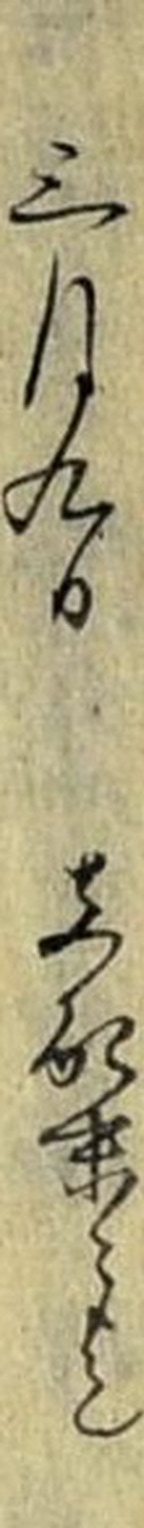三月九日支配末々迄
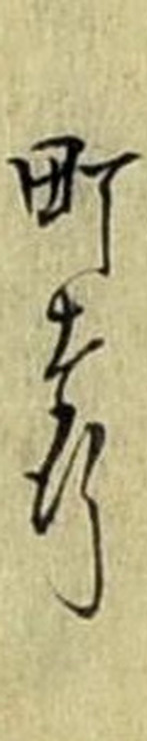町奉行
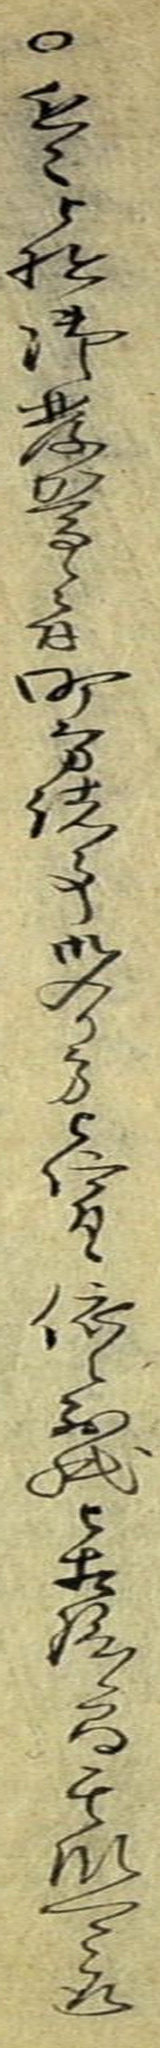〇近々被遊御発駕候ニ付町方諸事御〆り方被仰付候依之別紙被相渡候間其段可被取
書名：命令之部 三
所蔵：福井県文書館 Fukui Prefectural Archives
